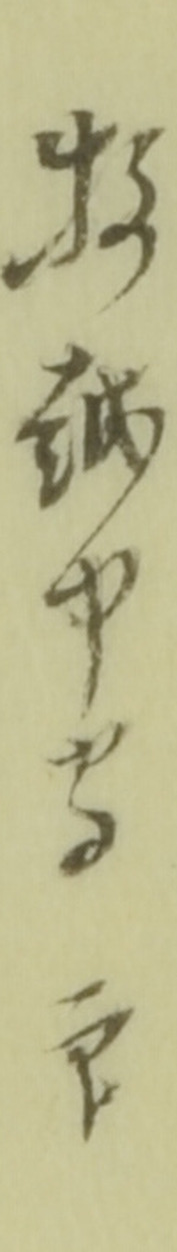牧越中守印
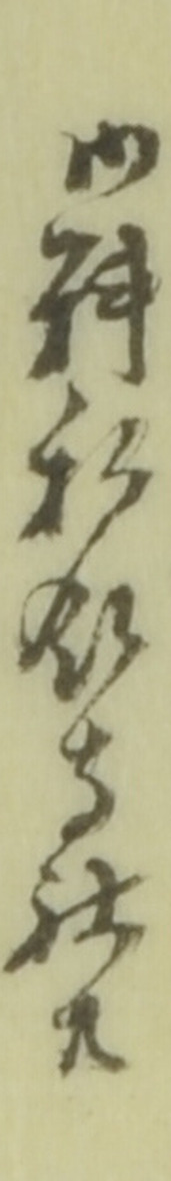御料私領寺社共
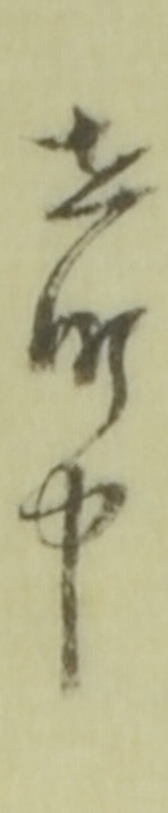在町中
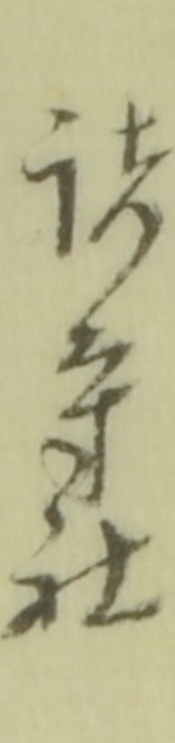諸寺社
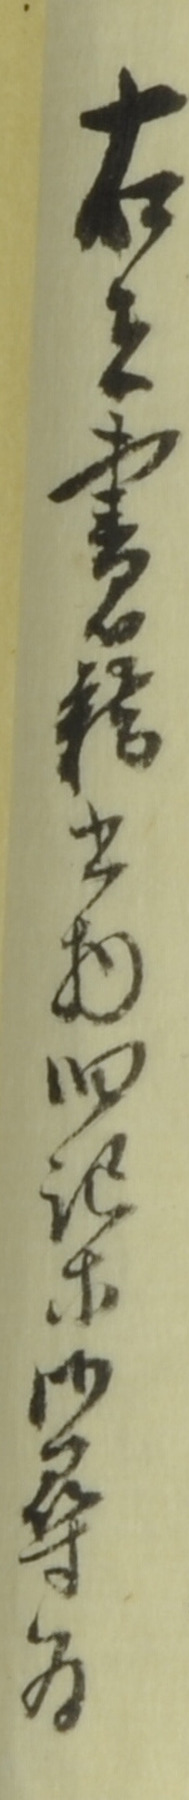右者書籍書物旧記等御尋為

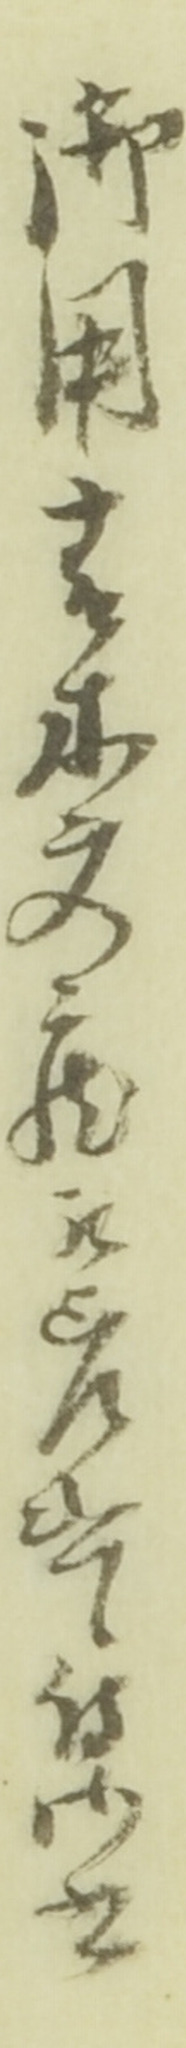御用才木文蔵え差出候付御書
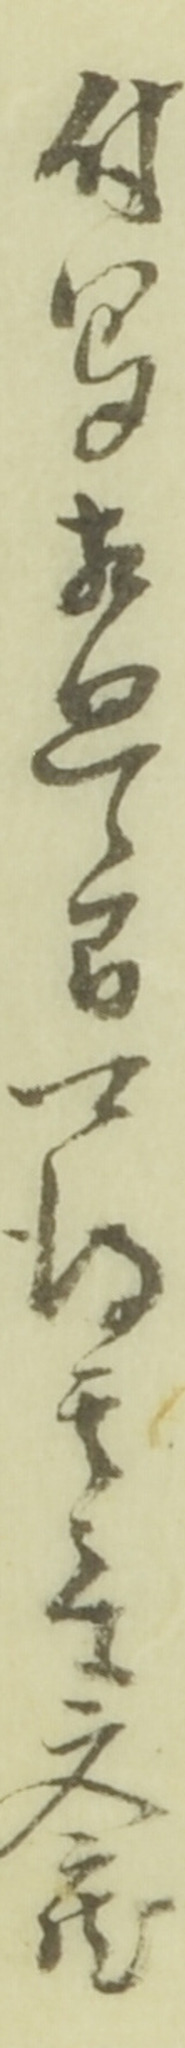付写相廻候間可得る其意文蔵
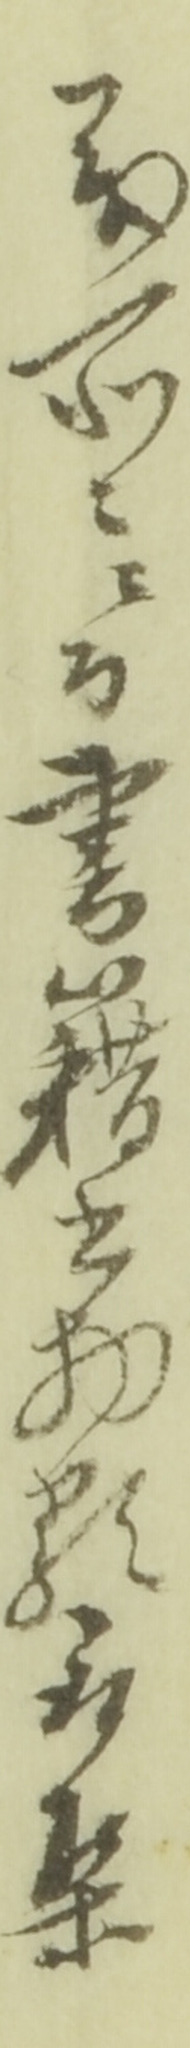当所二而書籍書物類取等
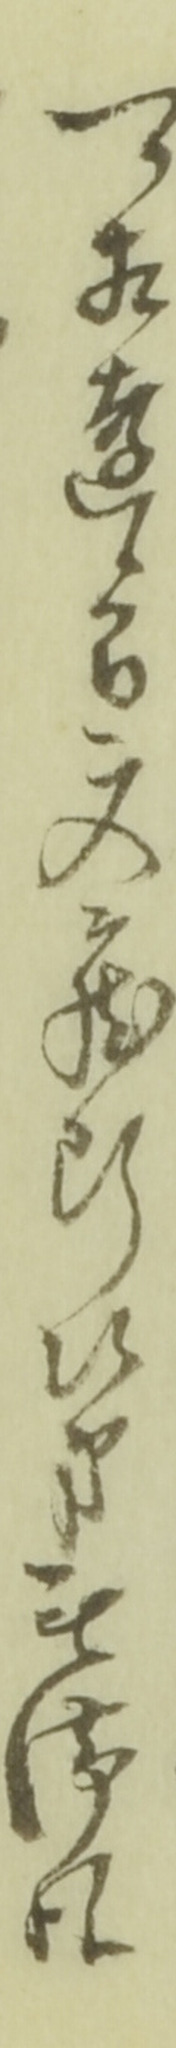可相達候間文蔵改次第無滞様
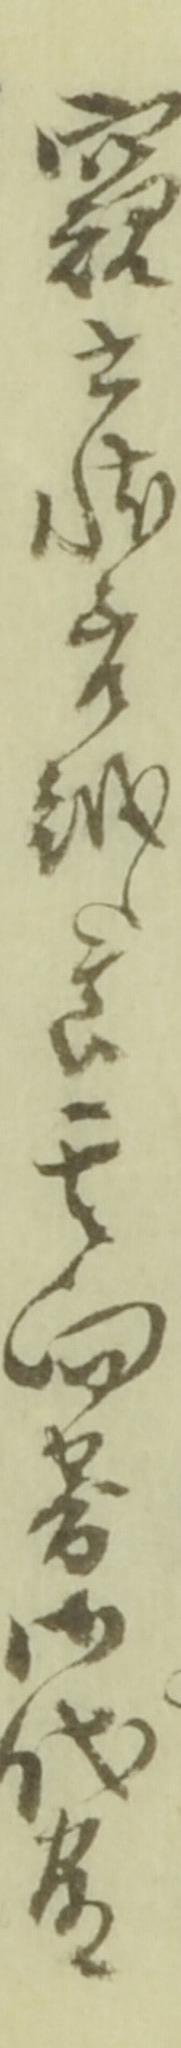窺之差越候節其向図り御代二
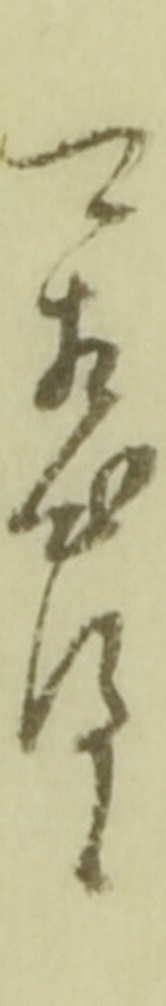可相心得候
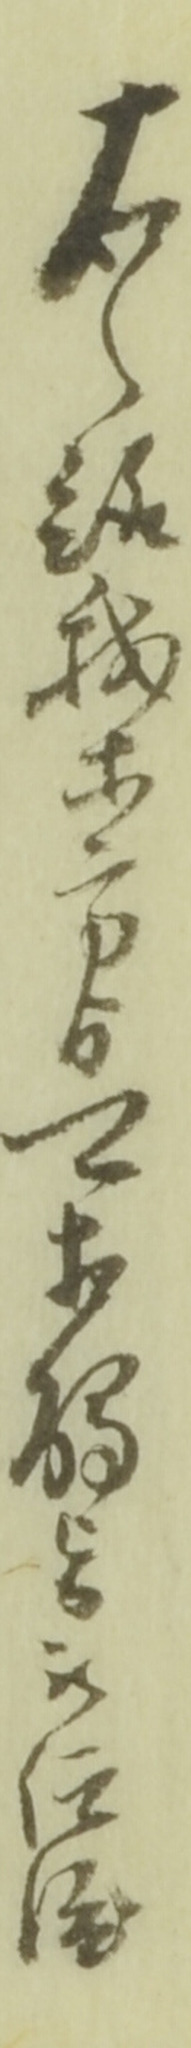右之趣我等方より可相触旨火仰渡
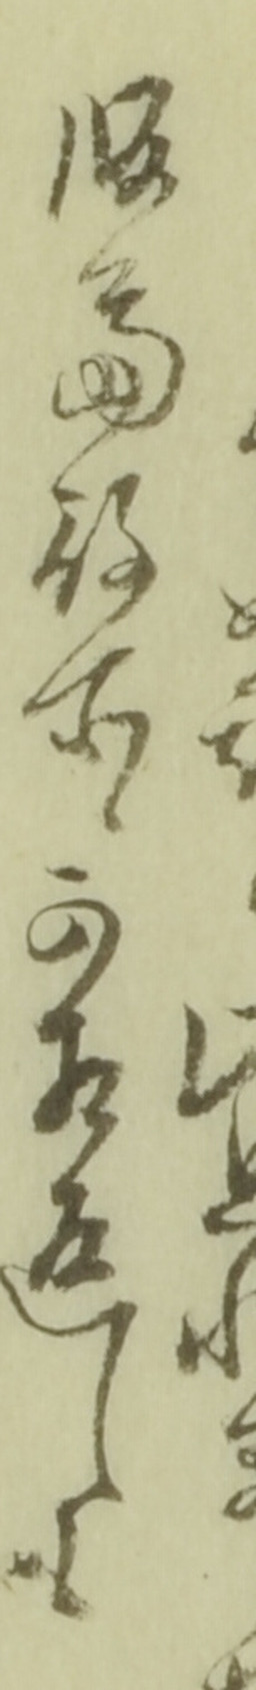当役所え可相返候以上
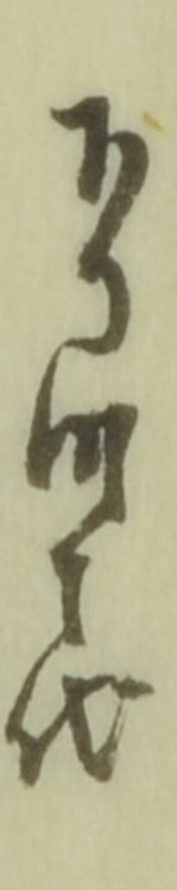下り町手代
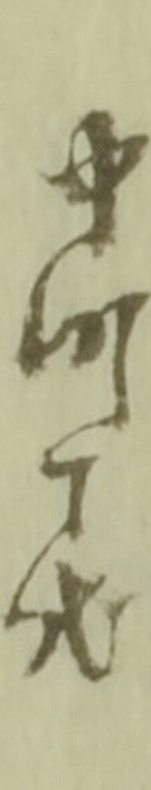中町手代
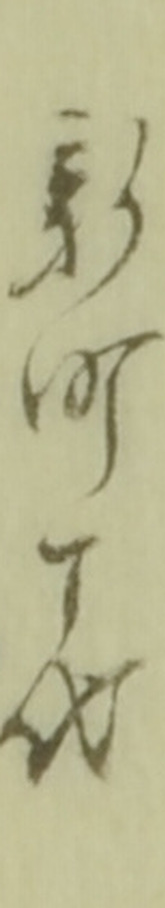新町手代
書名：御公儀様御領主様御触書控
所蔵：伊那市立高遠町図書館・合同会社AMANE
